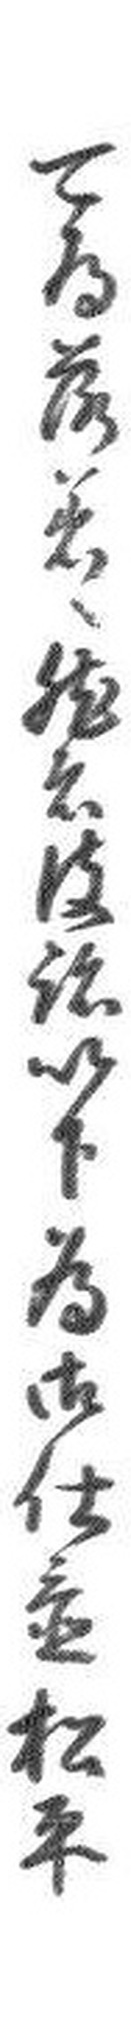可為落着候然者彼跡以下為御仕置松平
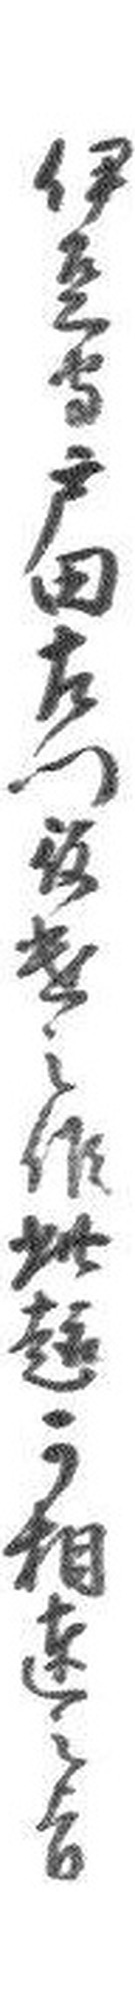伊豆守戸田左門被遣之候此趣可相達之旨
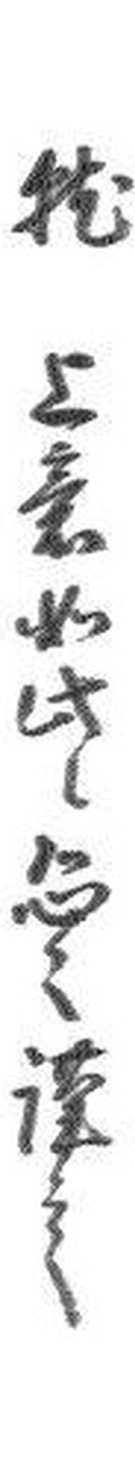就上意如此候恐々謹言
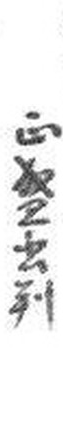正盛書判
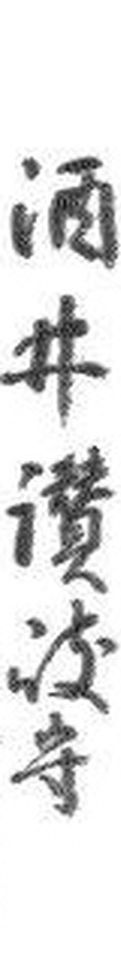酒井讃岐守
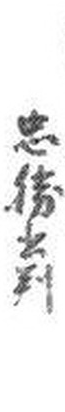忠勝書判
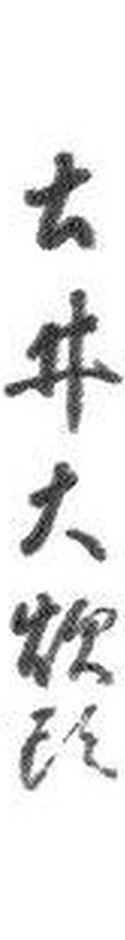土井大炊頭
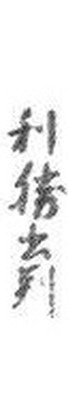利勝書判

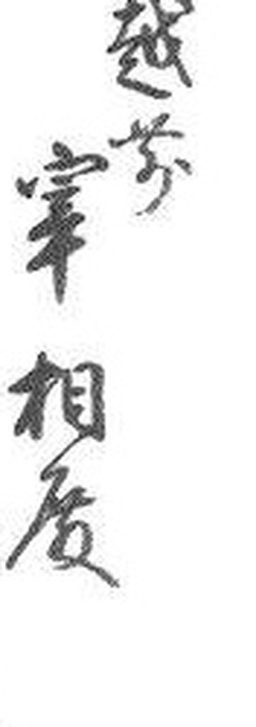宰相殿
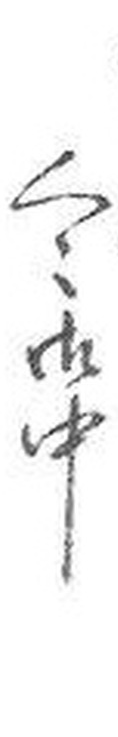人々御中
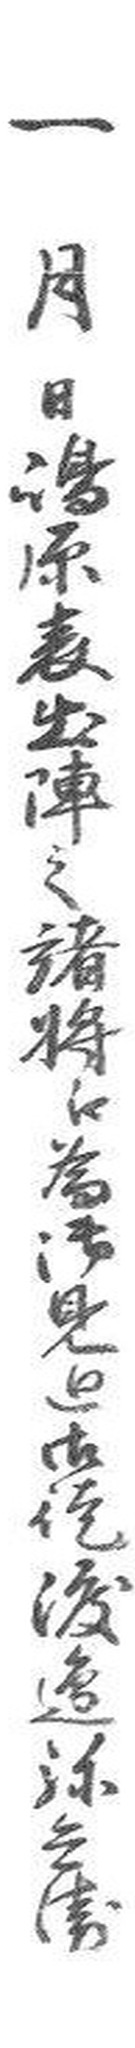一月日島原表出陣之諸将江為御見廻御徒渡辺弥兵衛
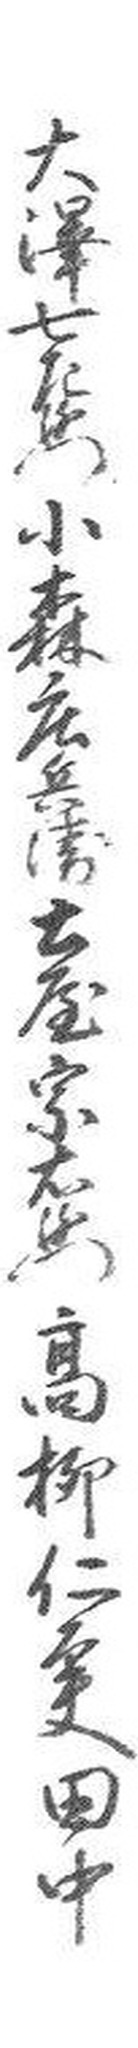大沢七左衛門小森庄兵衛土屋宗右衛門高柳仁太夫田中
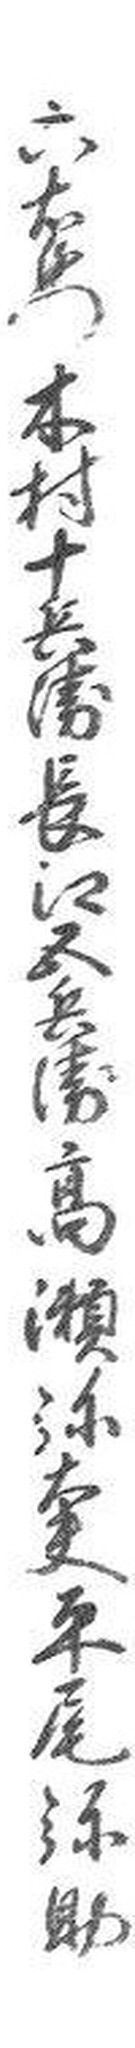六右衛門木村十兵衛長江五兵衛高瀬弥太夫平尾弥助
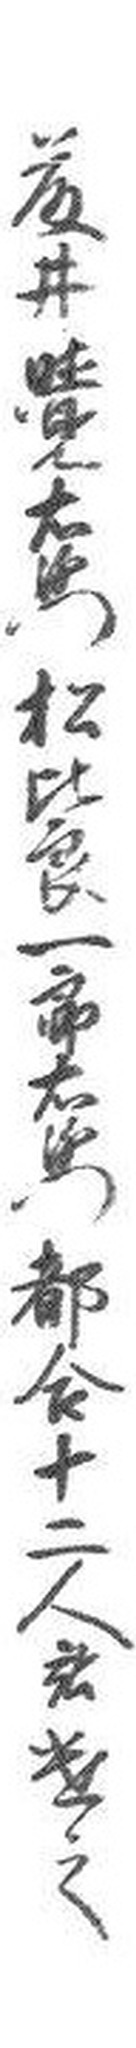藤井覚右衛門松比良一郎右衛門都合十二人被遣之
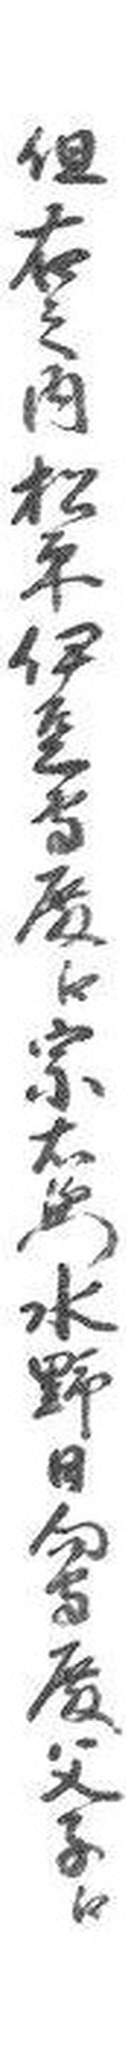但右之内松平伊豆守殿江宗右衛門水野日向守殿父子江
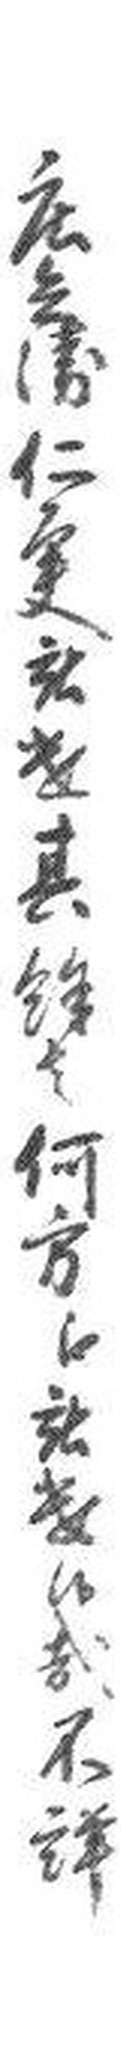庄兵衛仁太夫被遣其余は何方江被遣候哉不詳
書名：家譜 四 忠昌公 従寛永七年到正保四年
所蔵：福井県文書館 Fukui Prefectural Archives
